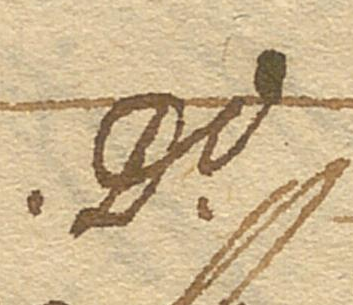D^o.
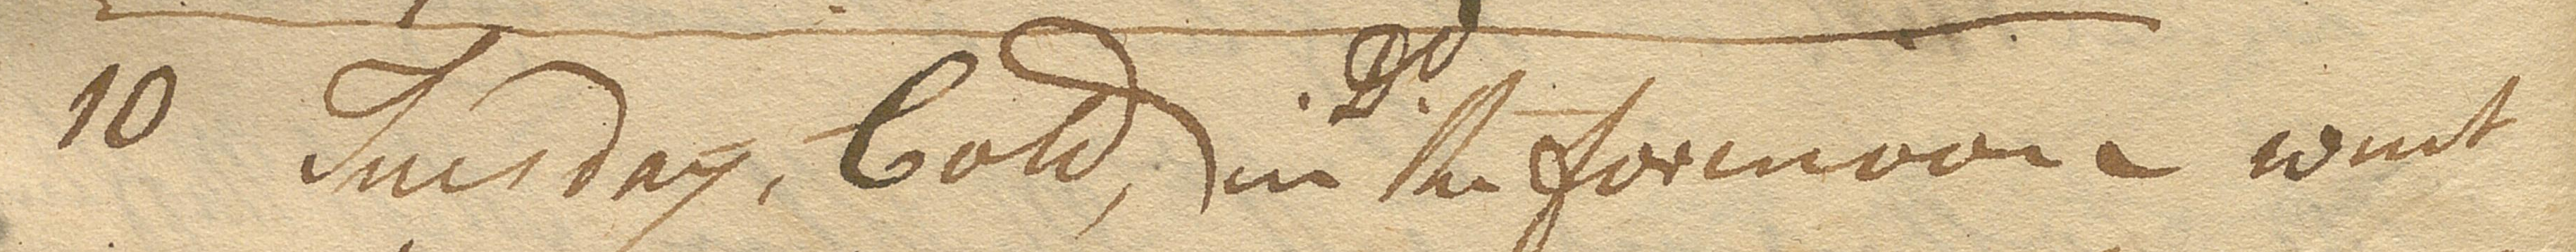10 Tuesday, Cold, in the forenoon went
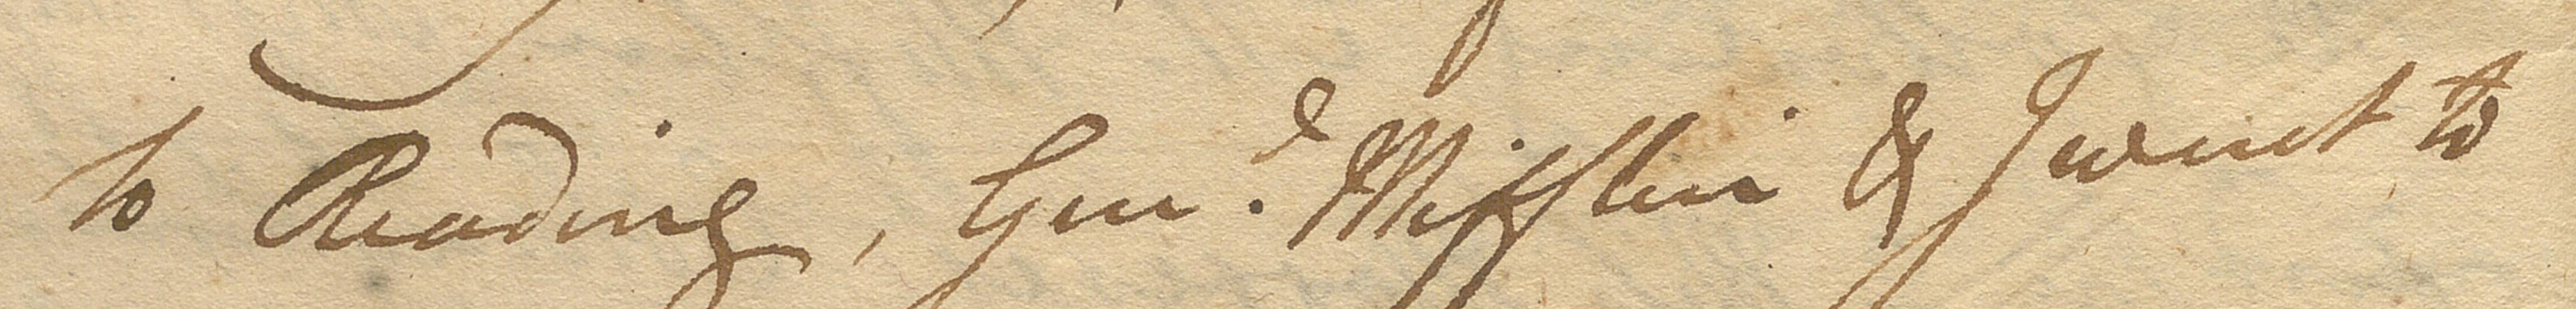to Reading Gen^l. Mifflin & I went to
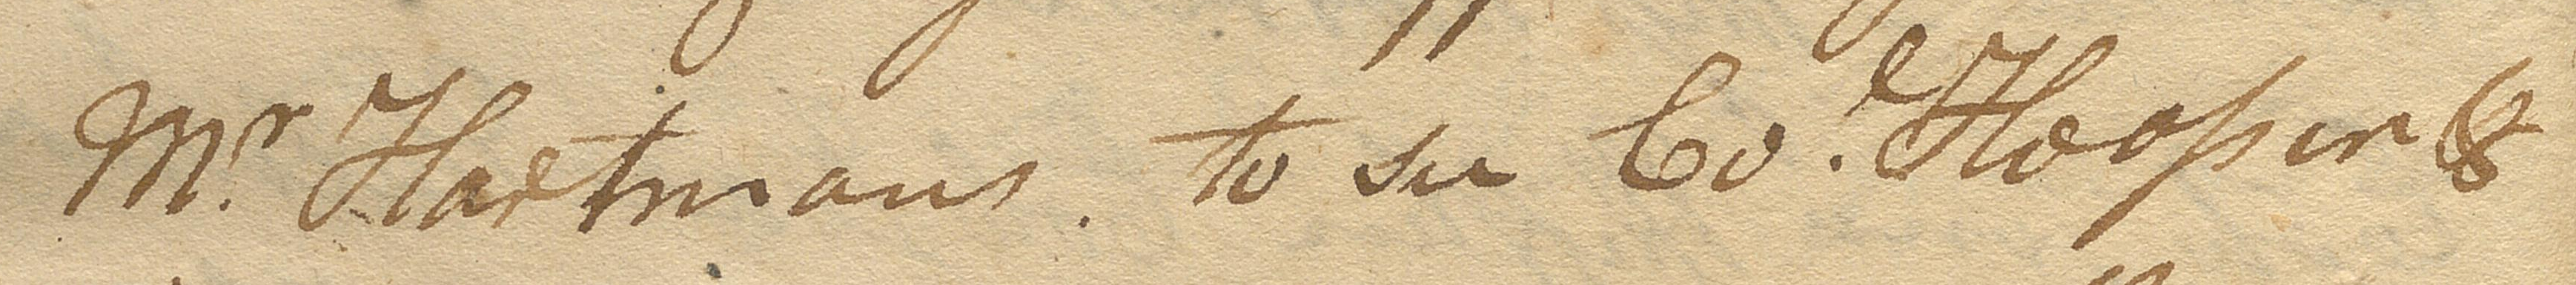M^r. Hartmans to see Co^l. Hooper &
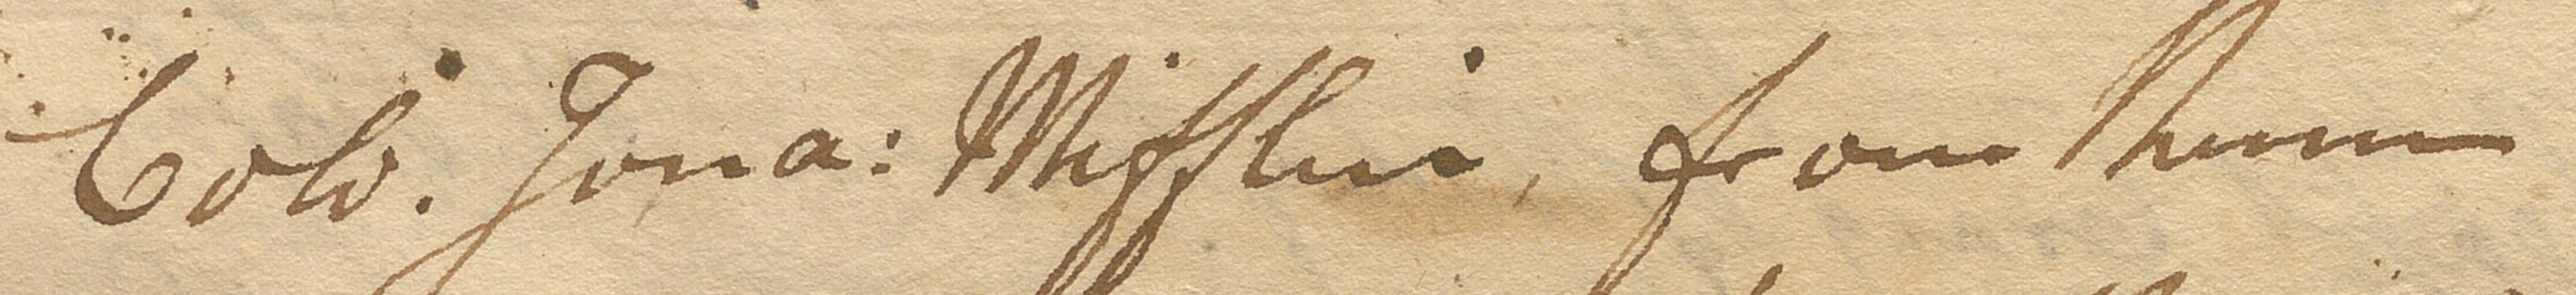Colo. Jona: Mifflin, from thence
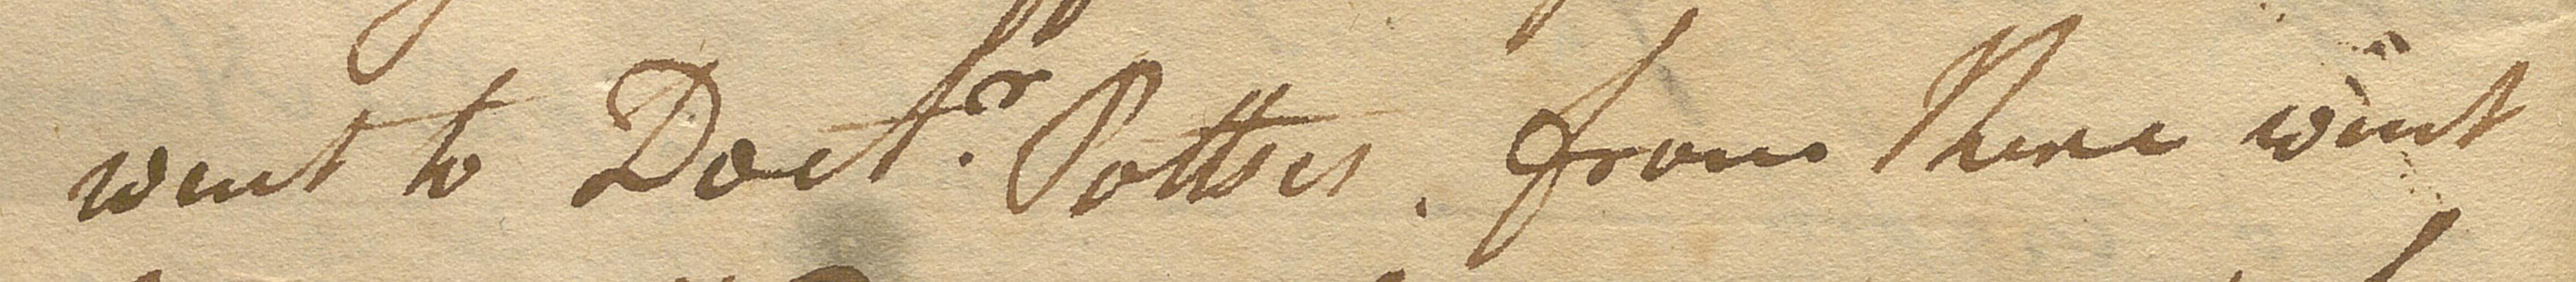went to Doct^r. Pottses from there went
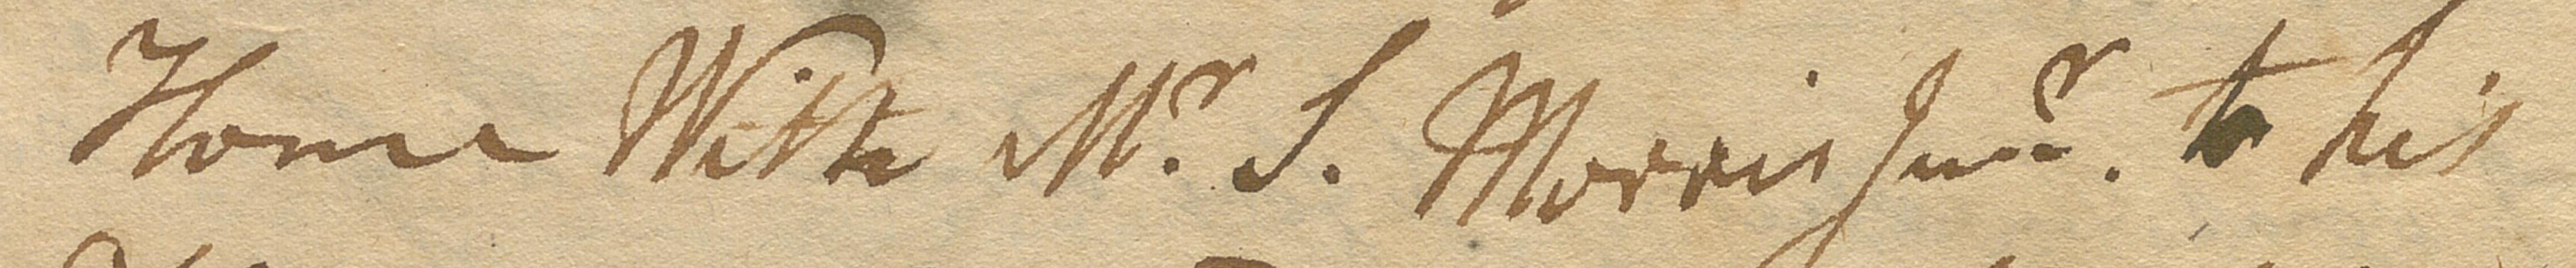Home With M^r. S. Morris Jun^r. to his
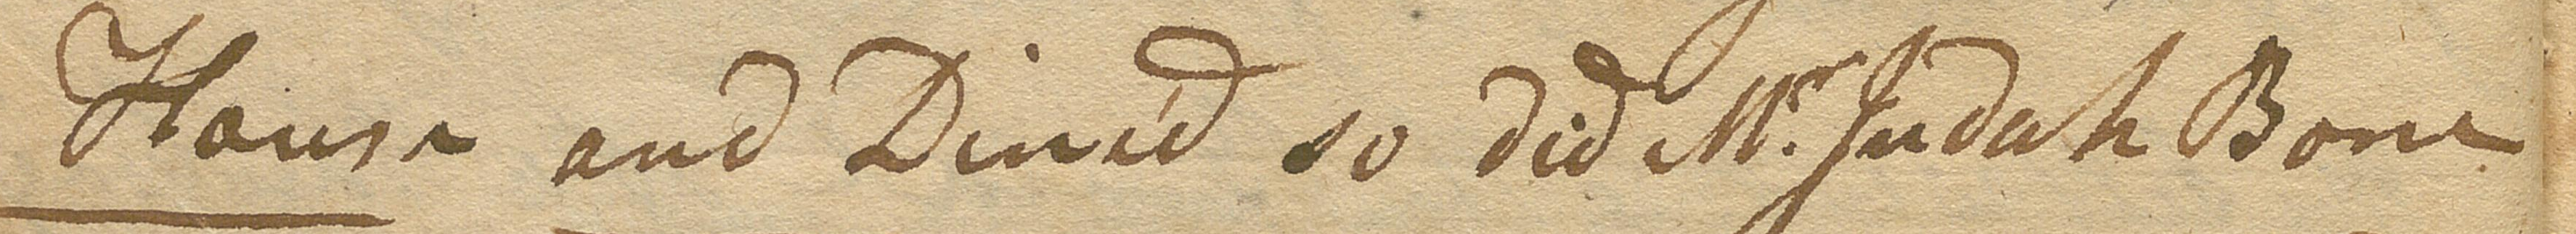House and Dined so did M^r. Judah Bone
